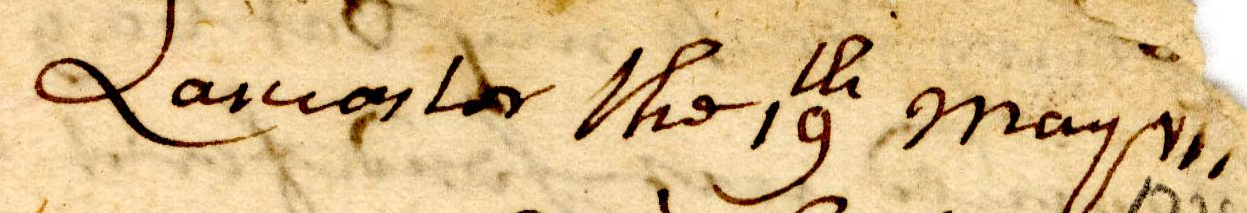Lancaster the 19^th May
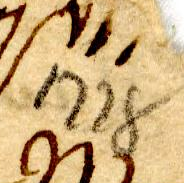1778
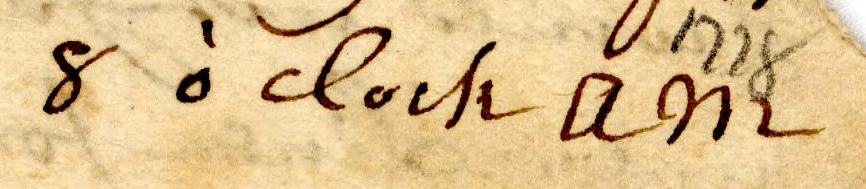8 o'clock AM
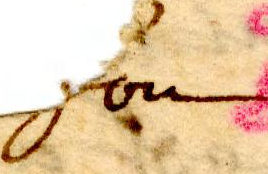Son
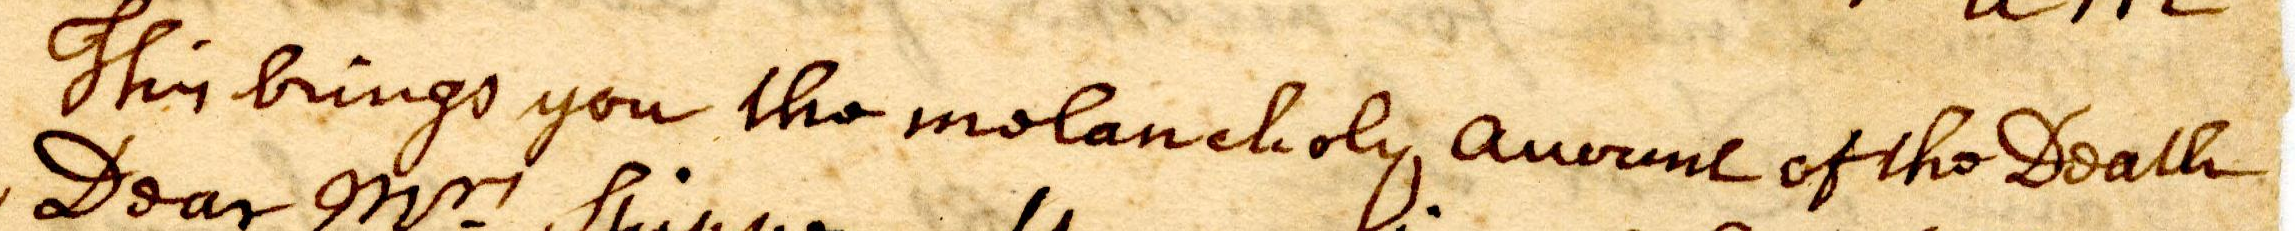This brings you the melancholy Account of the Death
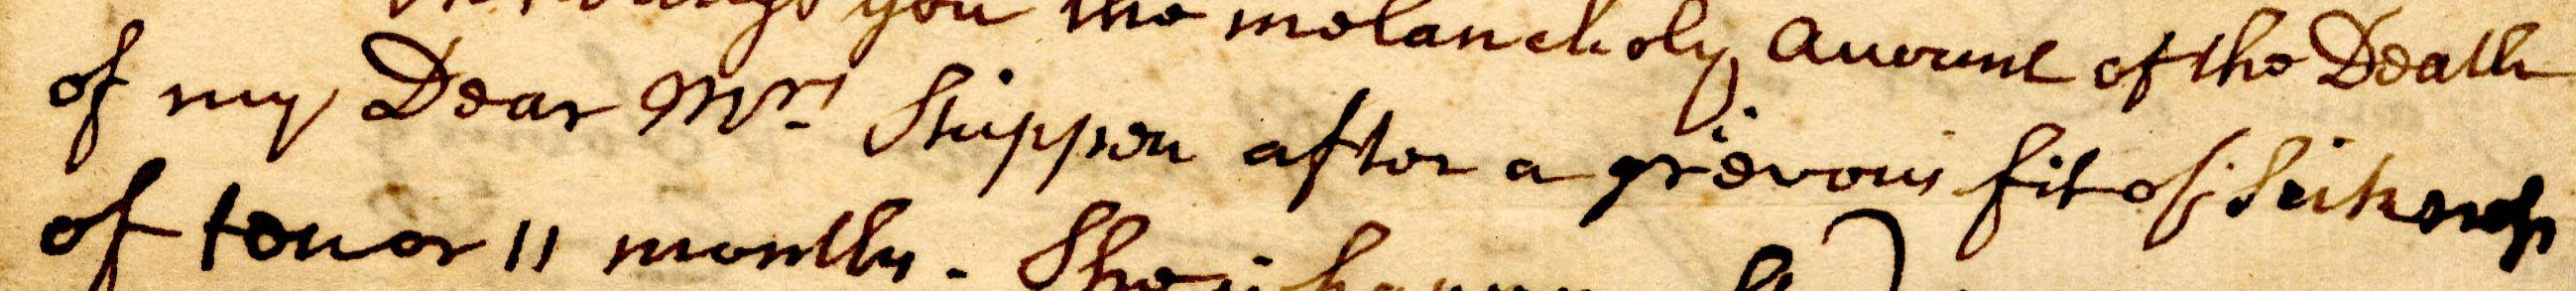of my Dear M^rs. Shippen after a grievous fit of sickness
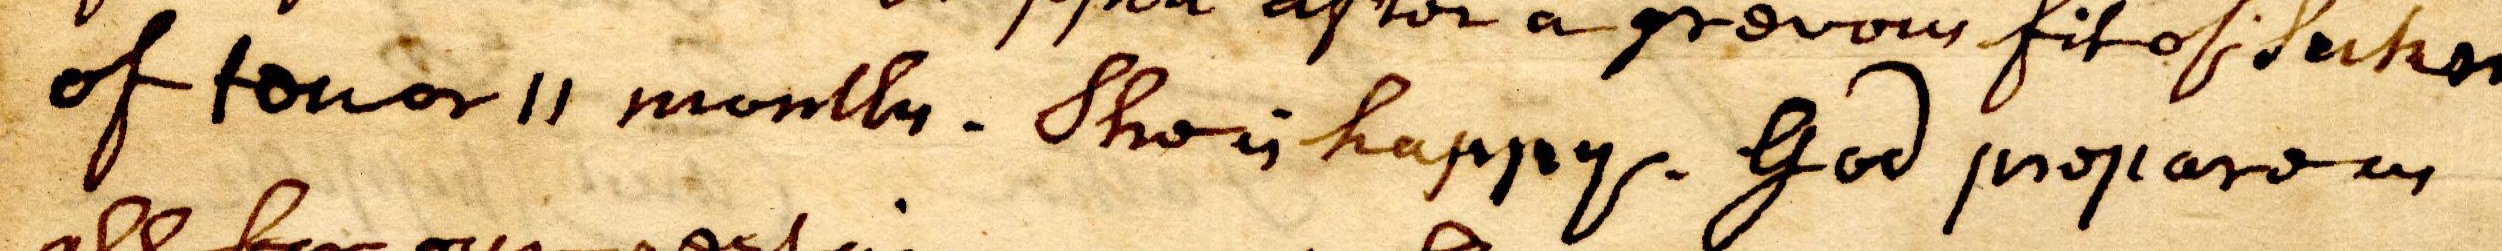of ten or 11 months. She is happy. God prepare us
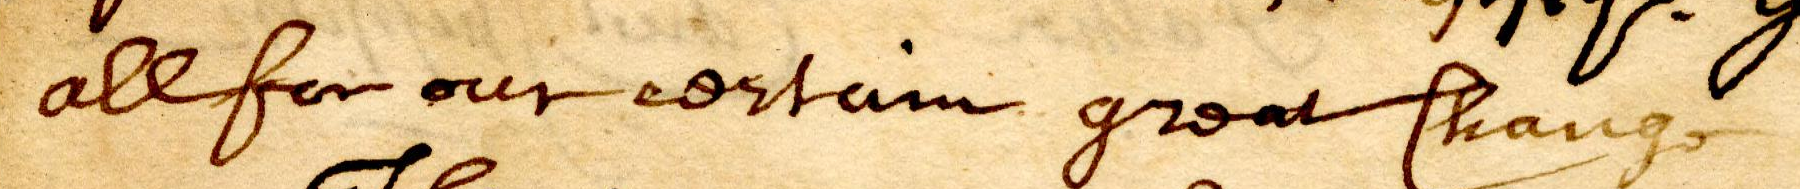all for our certain great Change-
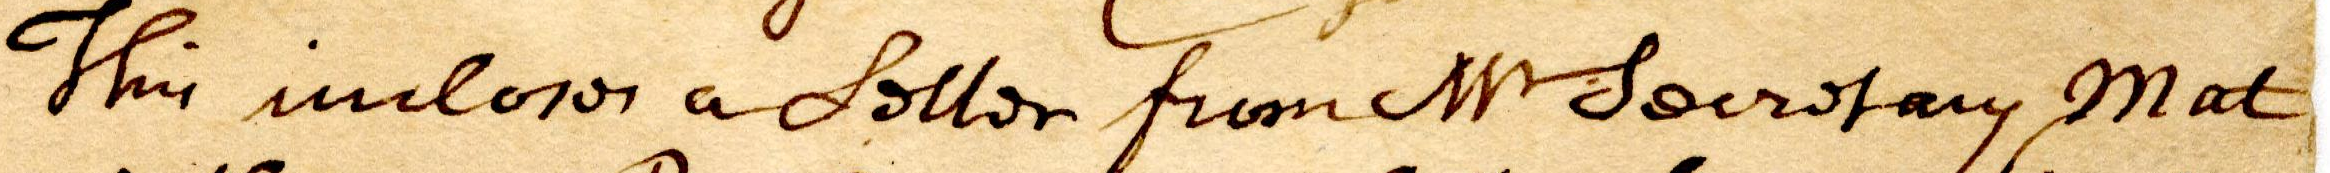This incloses a Letter from Mr Secretary Mat
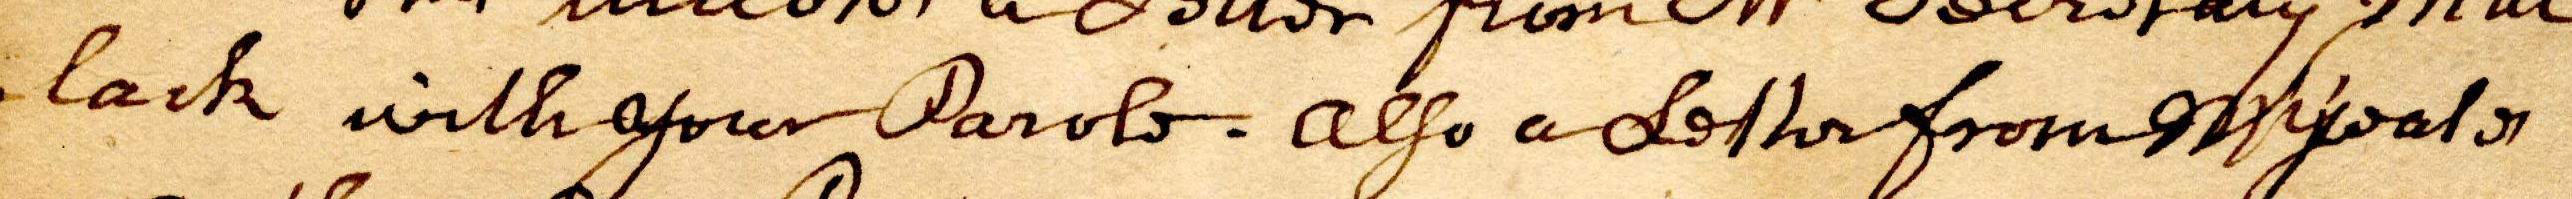lack with Your Parole. Also a Letter from M^r Yeates
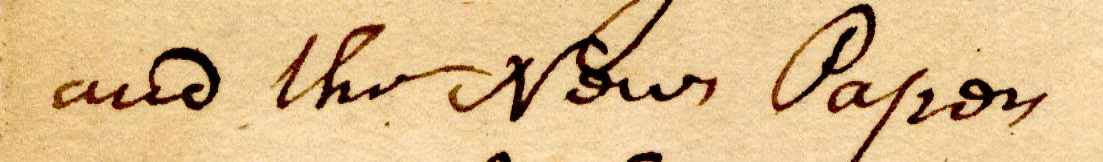and the News Papers
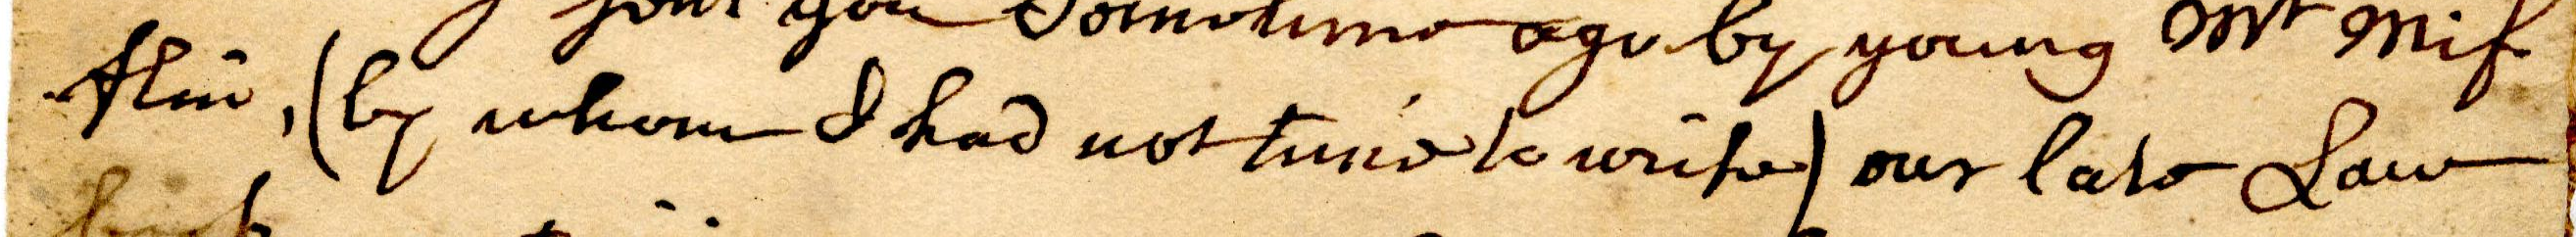flin, (by whom I had not tried to write) our late Law
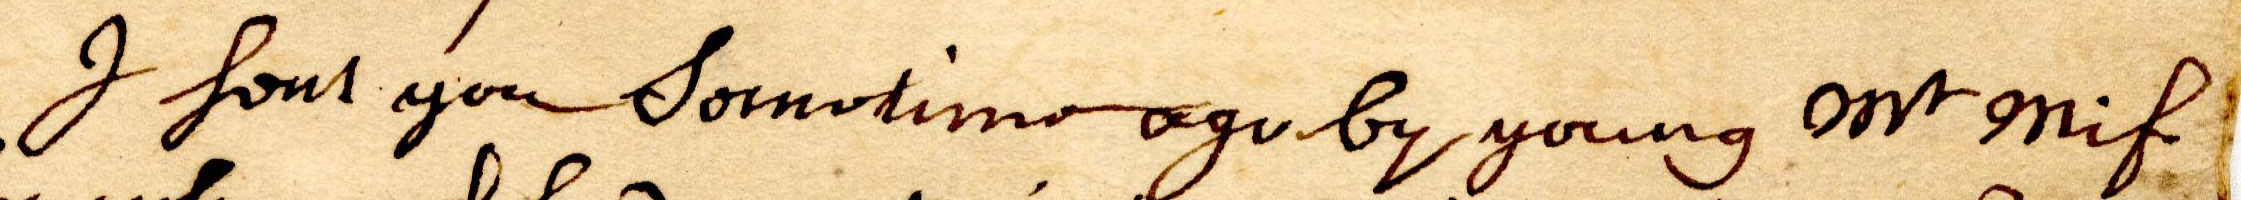I sent you Sometime ago by young M^r Mif
